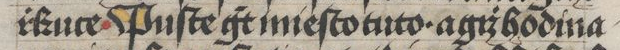ṙkuce.Puẛte ḡt mieſto tuto.a giż hodina
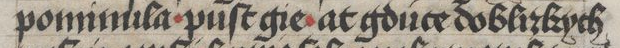pominula.puſt gie.at gdúce doblizkych
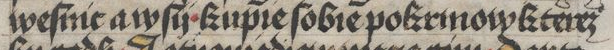weſnic.A wſij.kupíe ſobie pokrmow.ktereż
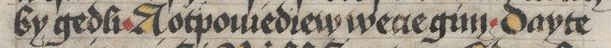by gedli.A otpowiediew wecie gim.Dayte
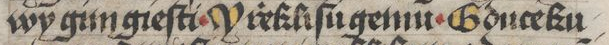wy gím gíeſti.Y ṙekli ſu gemu.Gduce ku¬
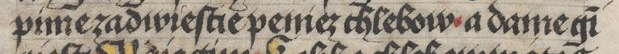píme zadwieſtie peniez chlebow.a dame gī
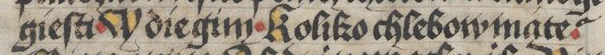gíeſti.Y ḋíe gim.Koliko chlebow mate?
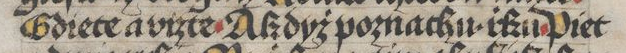Gdiete a vizte.A kdyż poznachu.ṙku.Piet
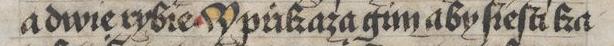a dwie rybie.Y pṙikaza gim aby ſíeſti ka¬
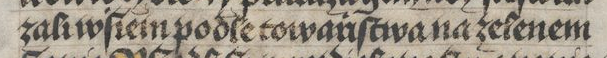zali wẛiem podle towaṙiſtwa na zelenem
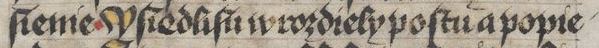ſienie.Y ſiedli ſu wrozdiely poſtu a popie¬
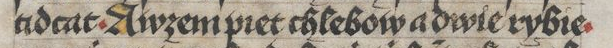tidcat.A vzem piet chlebow a dwie rybie.
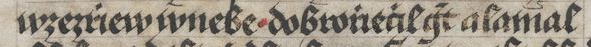wzezṙiew wnebe.dobroṙieċil ḡt alamal
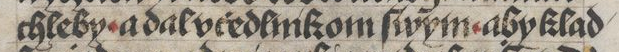chléby.a dal vċedlnikom ſwym.aby klad¬
